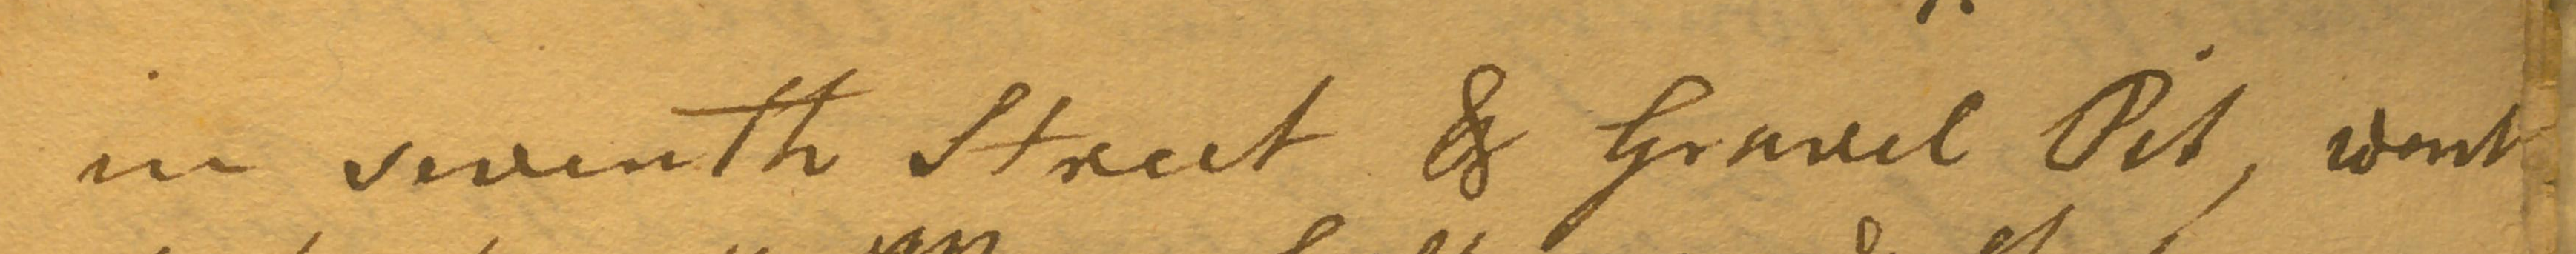in seventh Street & Gravel Pit, went
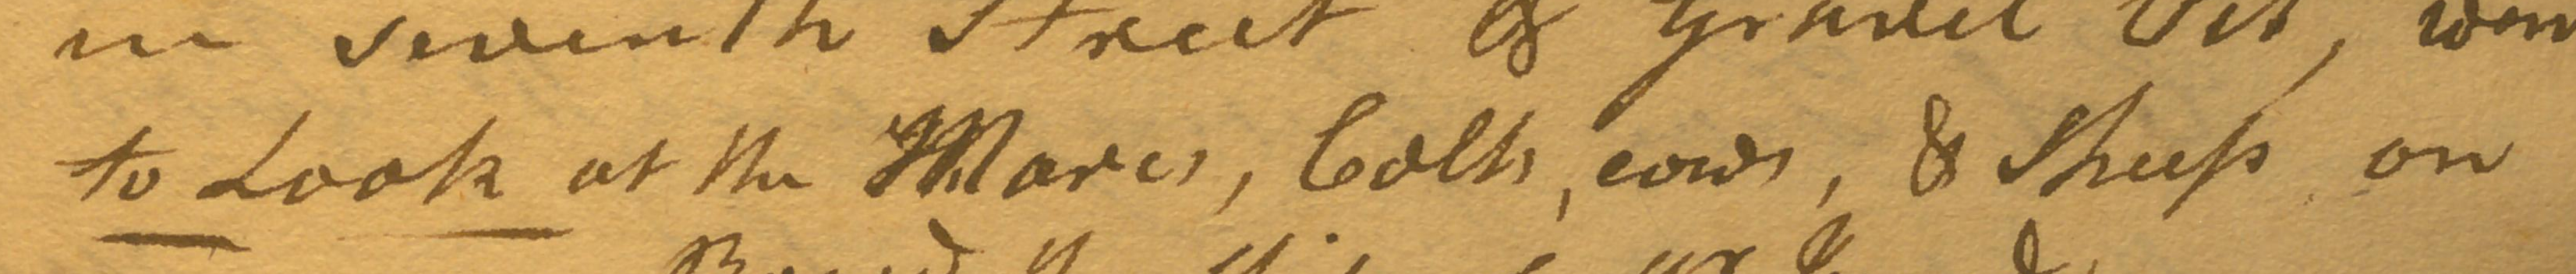to Look at the Mares, Colts, cows, & Sheep on
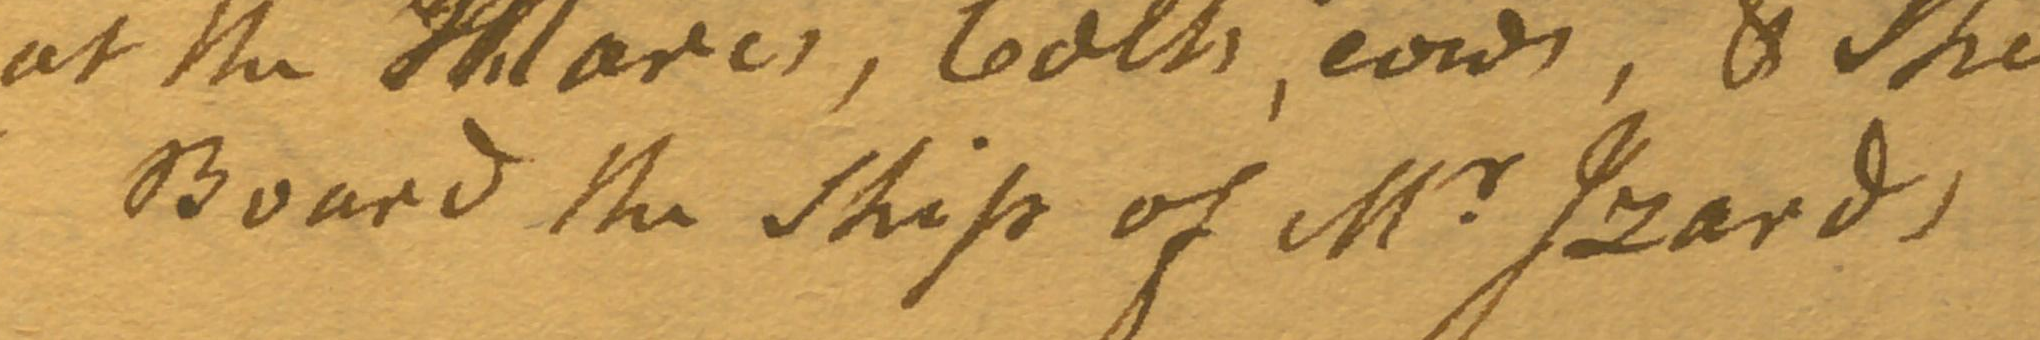Board the ship of M^r. Izards
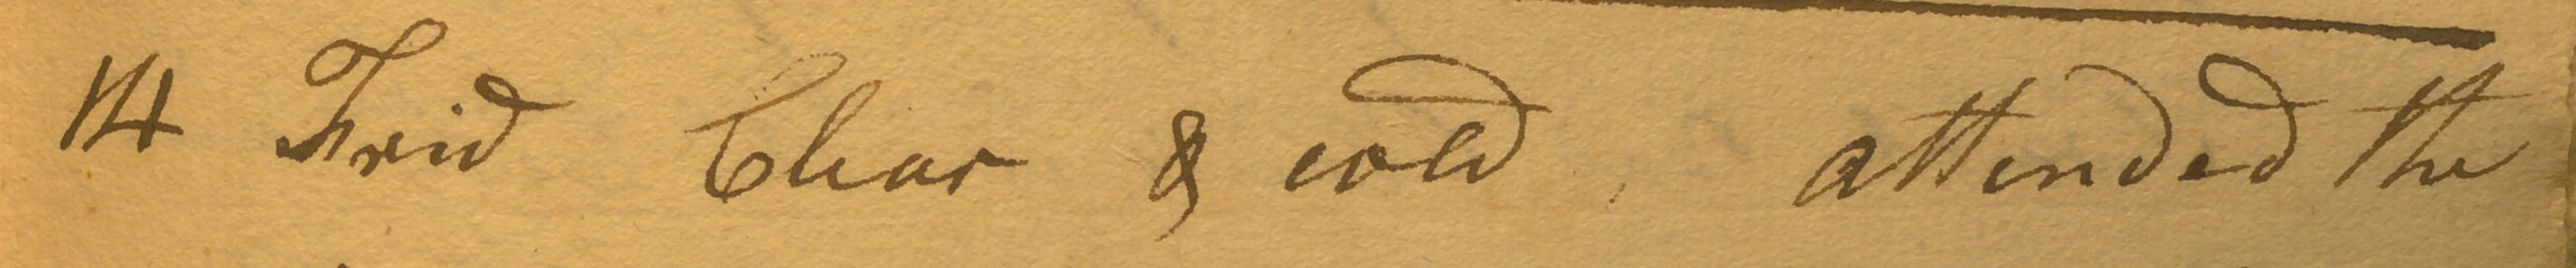14 Frid Clear & cold attended the
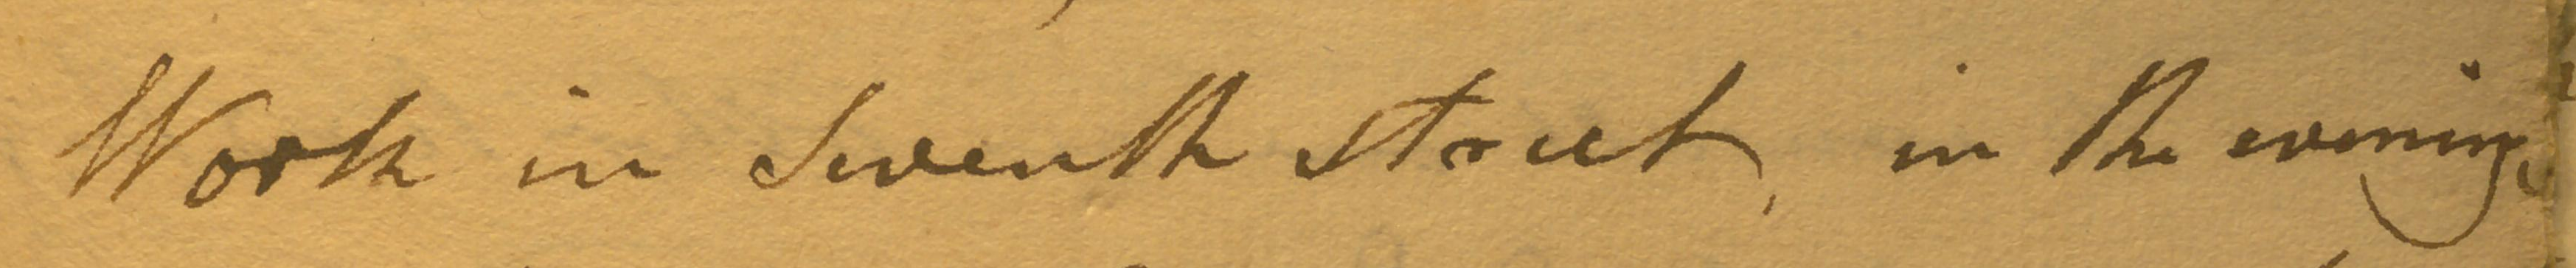Wook in seventh street in the evening
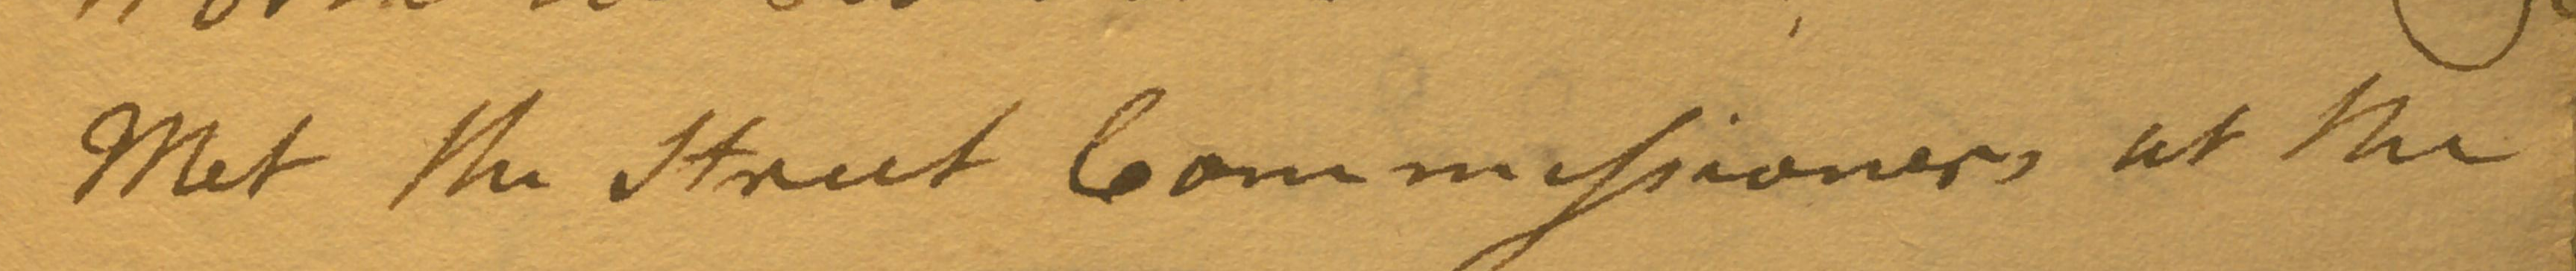Met the Street Commissioners at the
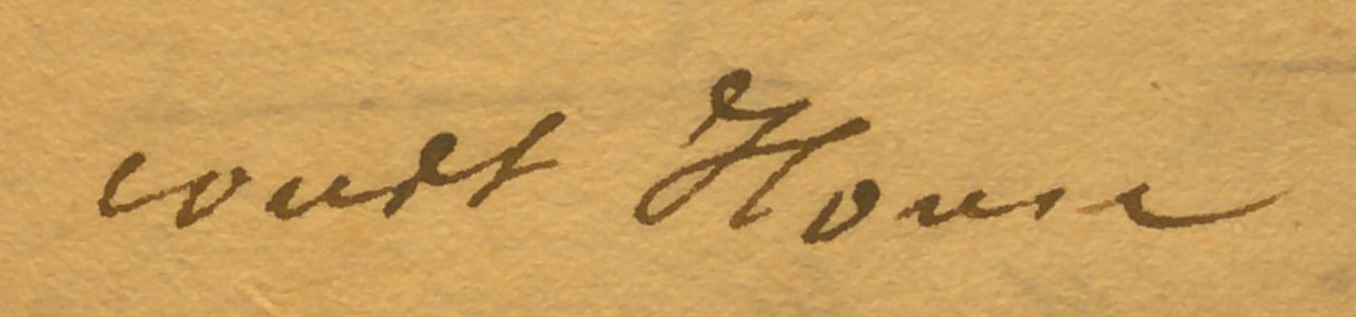court House
